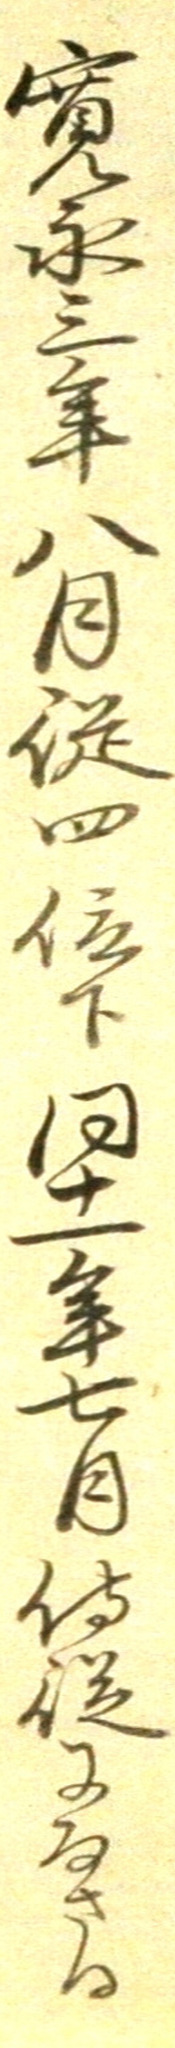寛永三年八月従四位下同十一年七月侍従になさる
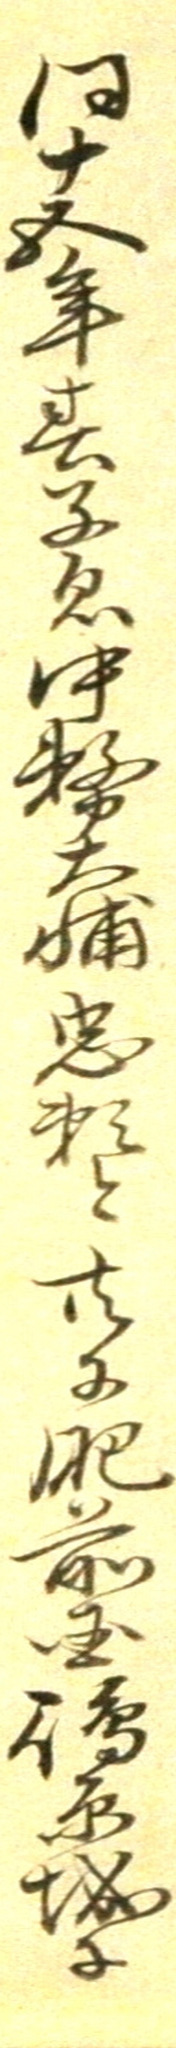同十五年春子息中務大輔忠頼と共に肥前国島原城に

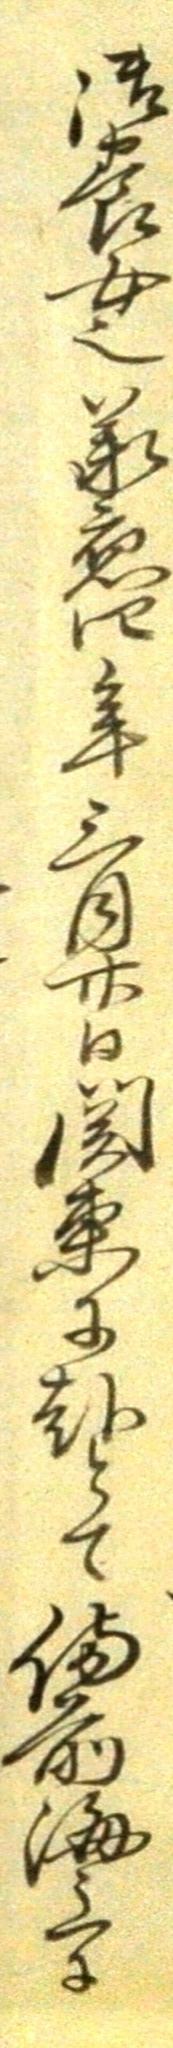御養女也承応四年三月廿日関東に赴とて備前海上に
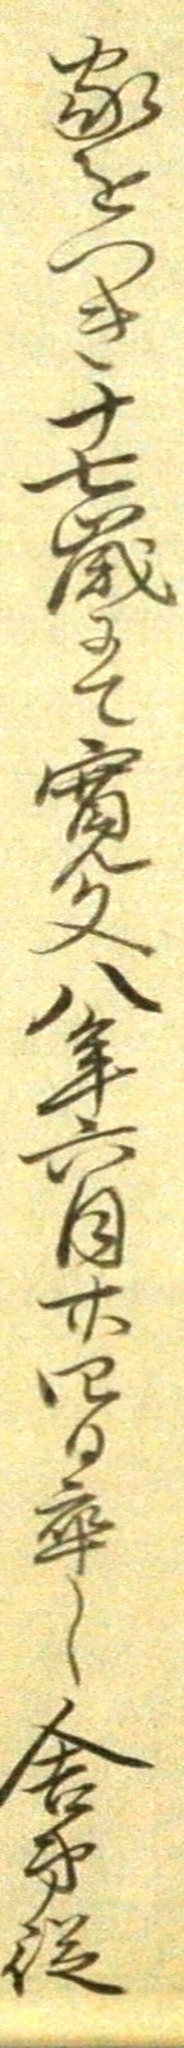家をつき十七歳にて寛文八年六月二十四日卒し舎弟従
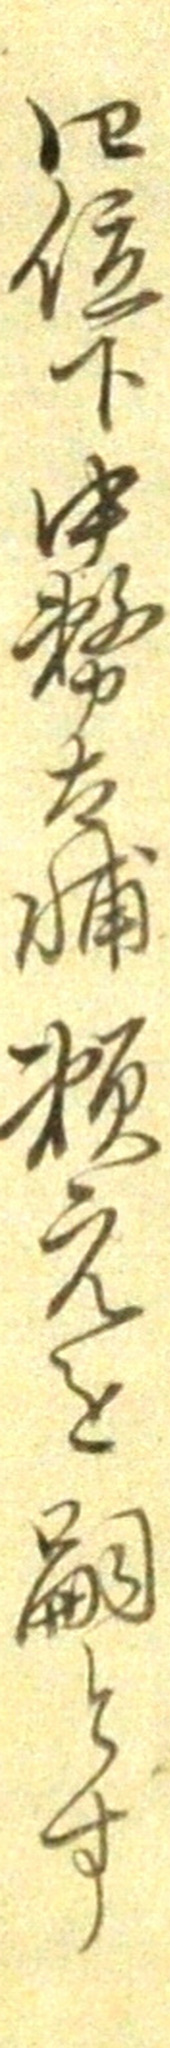四位下中務太輔頼元を嗣とす
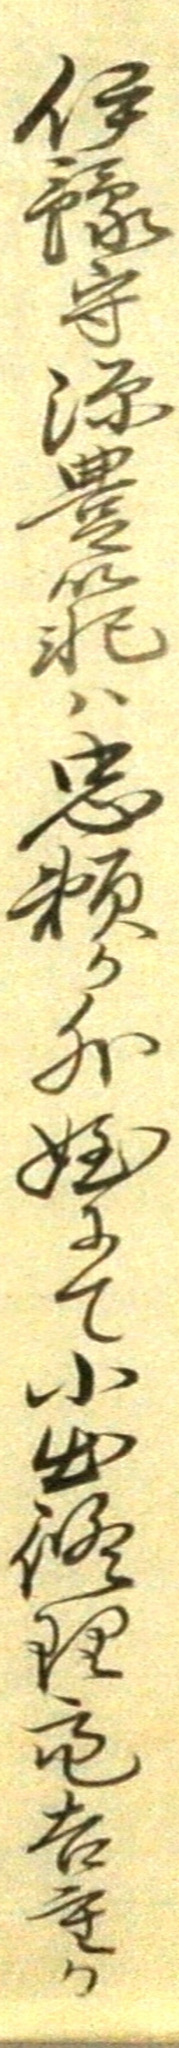伊予守源豊範は忠頼か外姪にて小出修理亮吉重か
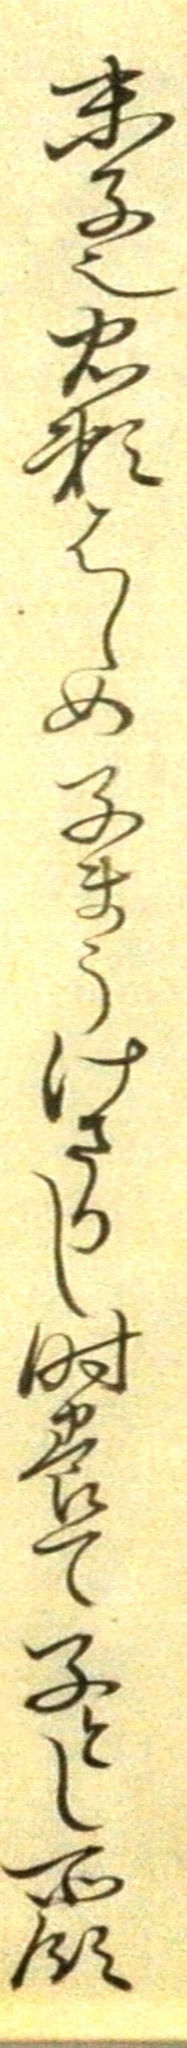末子也忠頼はしめ子まうけさりし時養て子とし所領
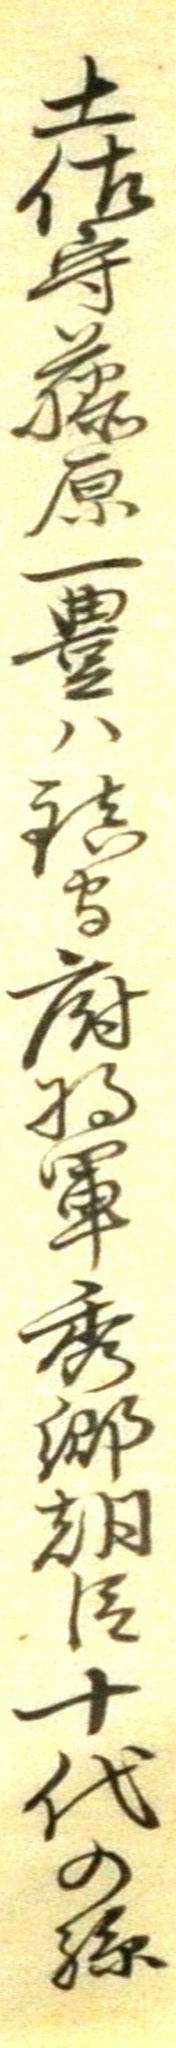土佐守藤原一豊は鎮守府将軍秀郷朝臣十代の孫
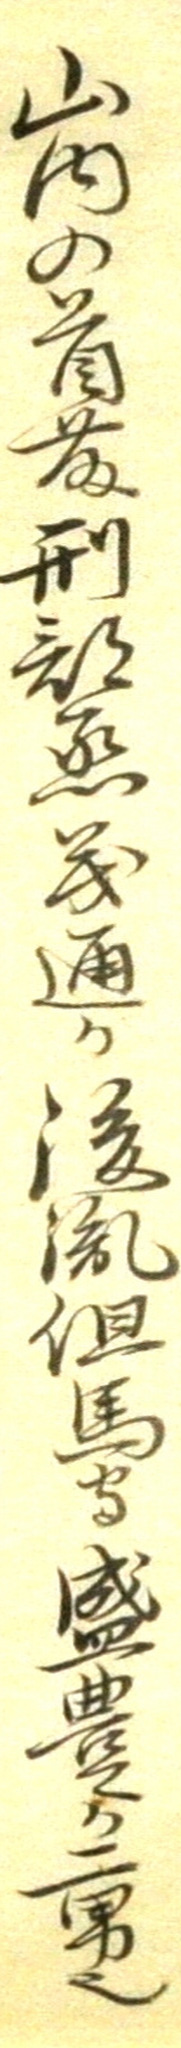山内の首藤刑部丞義通か後胤但馬守盛豊か二男也
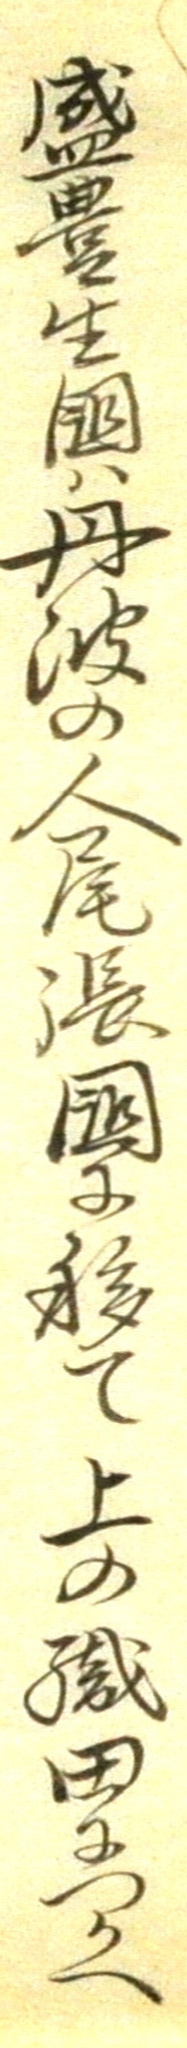盛豊生国は丹波の人尾張国に移て上の織田につかへ
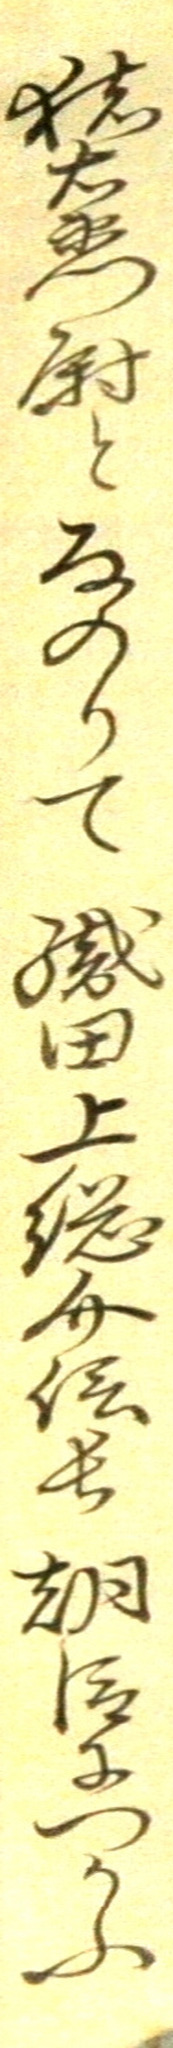猪右衛門尉と名のりて織田上総介信長朝臣につかふ

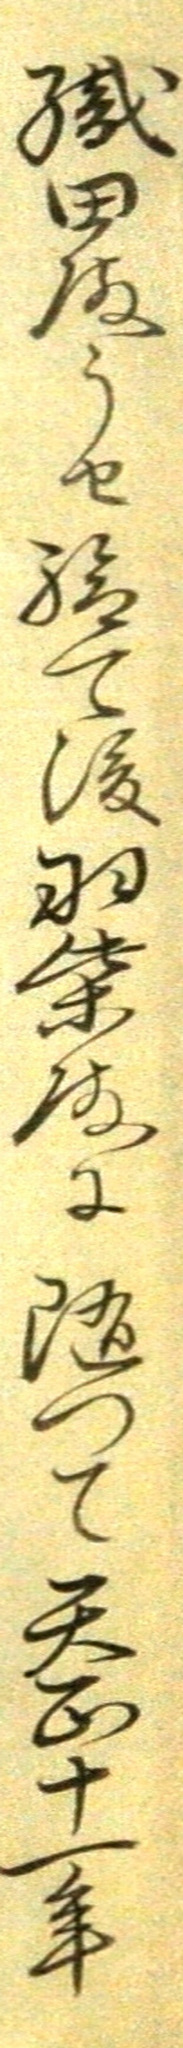織田殿うせ給て後羽柴殿に随つて天正十一年
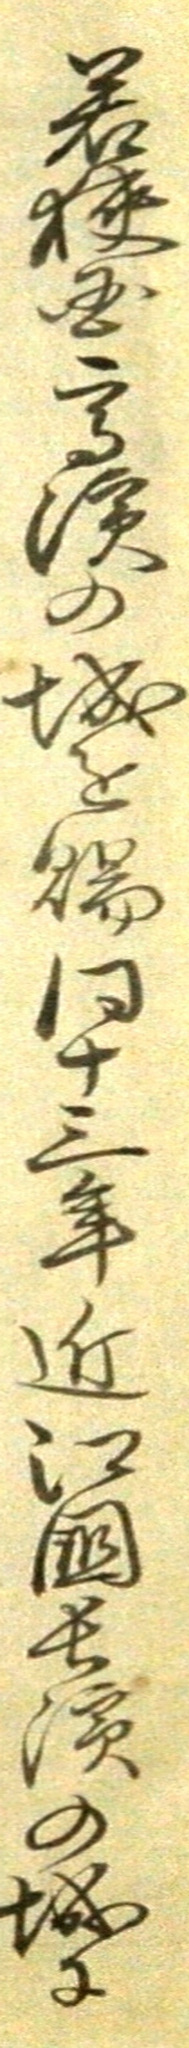若狭国高浜の城を賜同十三年近江国長浜の城に
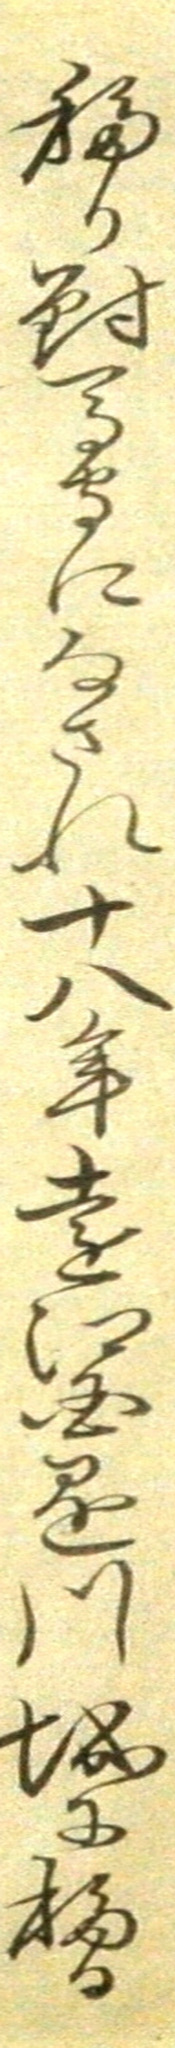移り対馬守になされ十八年遠江国懸川城に移る
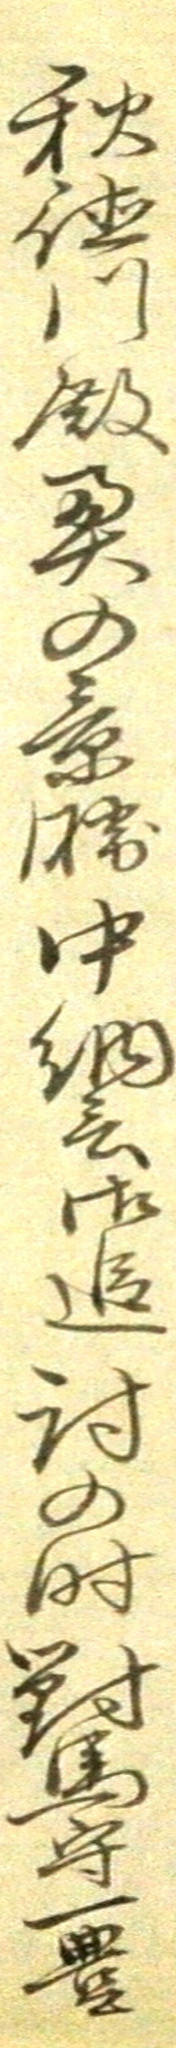秋徳川殿奥の景勝中納言御追討の時対馬守一豊
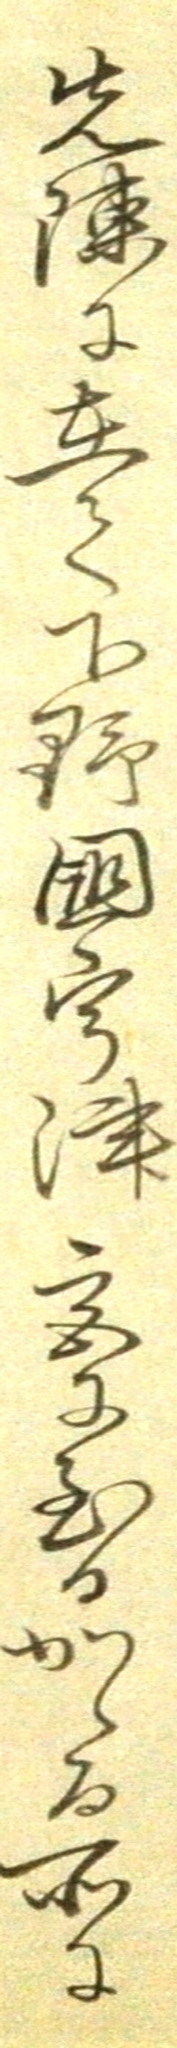先陣に在て下野国宇津宮に至るかゝる所に
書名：藩翰譜（七・上）
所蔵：伊那市立高遠町図書館・合同会社AMANE
